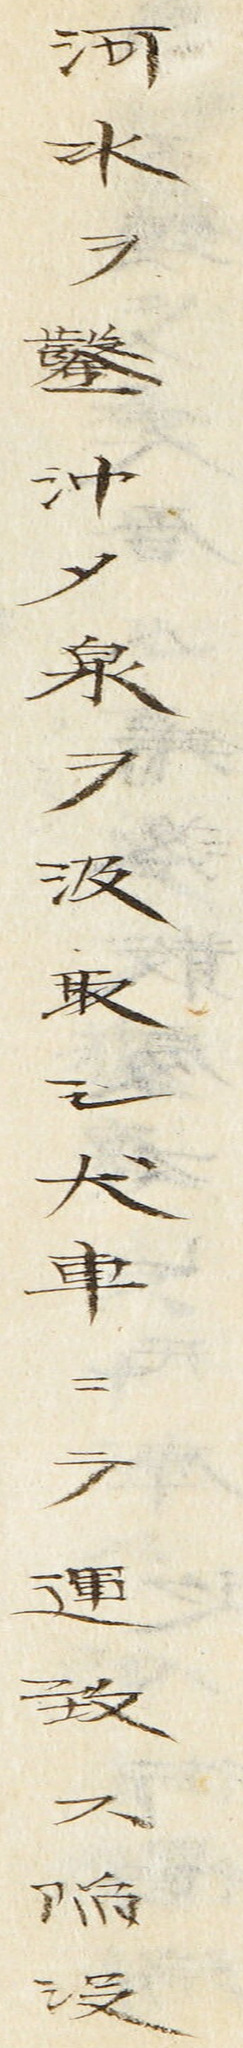河水ヲ鑿沖シテ泉ヲ汲取シ犬車ニテ運致ス陥没
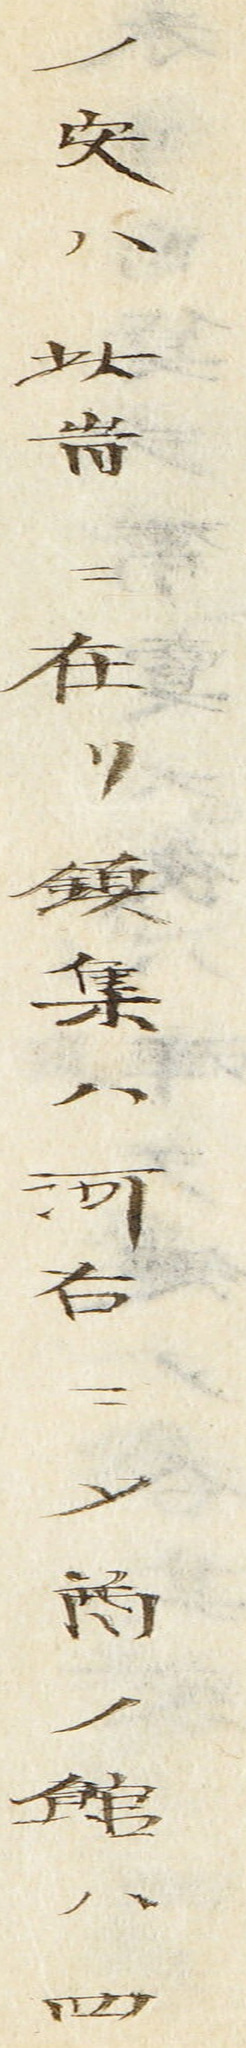ノ穴？ハ此旹ニ在リ鎮集ハ河右ニシテ酋ノ館ハ四
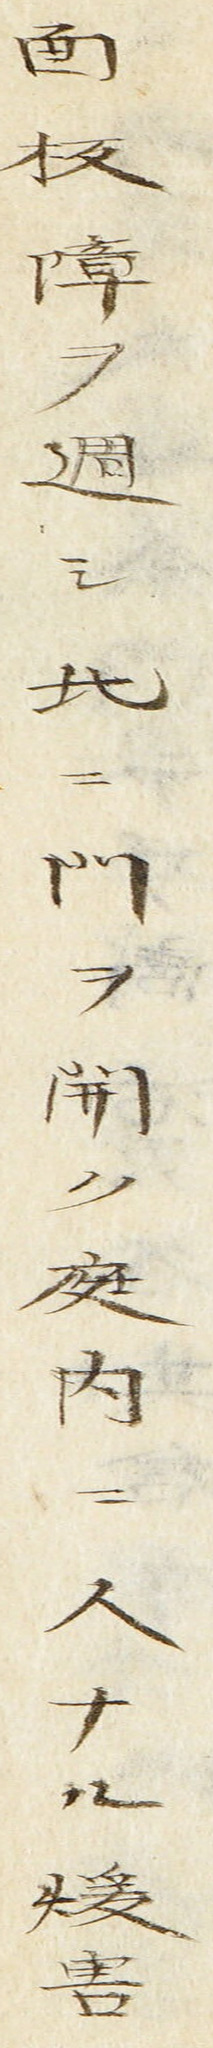面板障ヲ週シ北ニ門ヲ開ク庭内ニ人ナル煖害
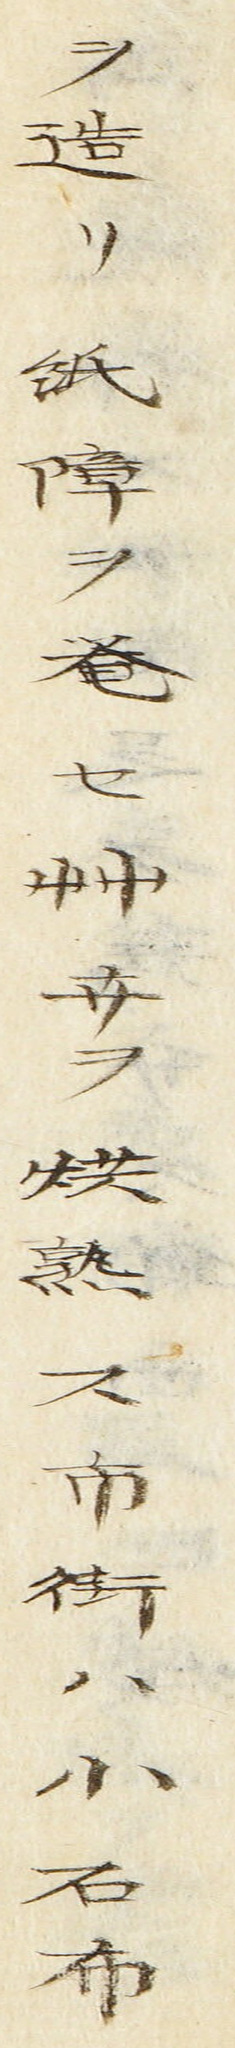ヲ造リ紙障ヲ奄セ艸卉ヲ烘熟ス市街ハ小石布

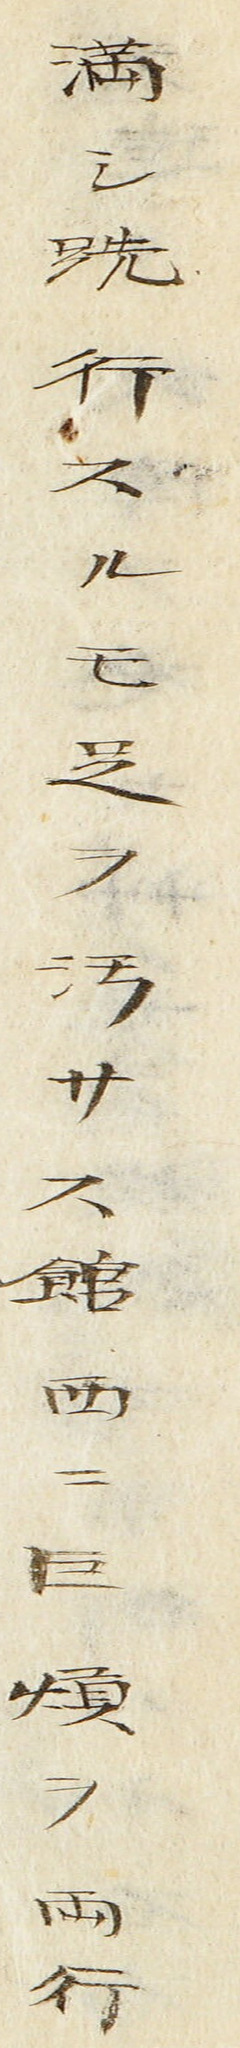満シ跣行スルモ足ヲ汚サス館西ニ巨熕ヲ両行
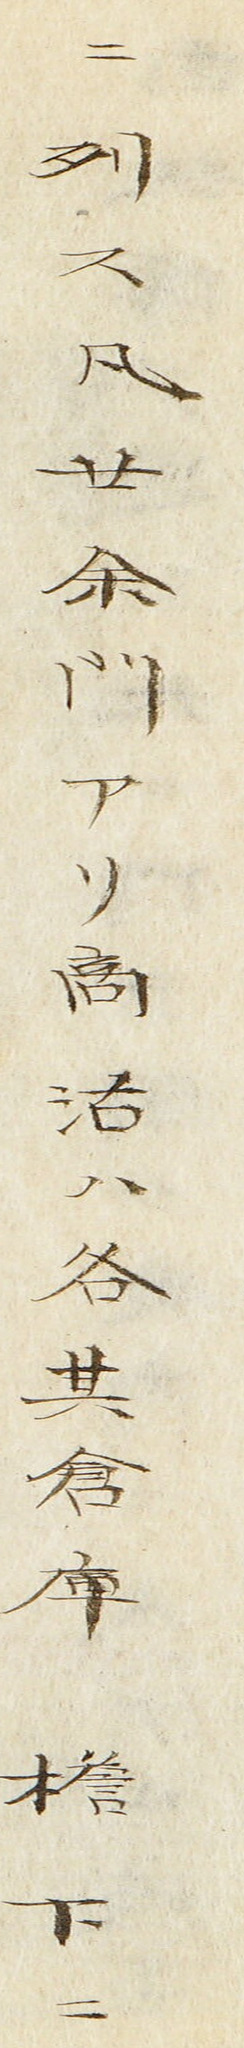ニ列ス凡廿余門アリ商沽ハ各其倉庫檐下ニ
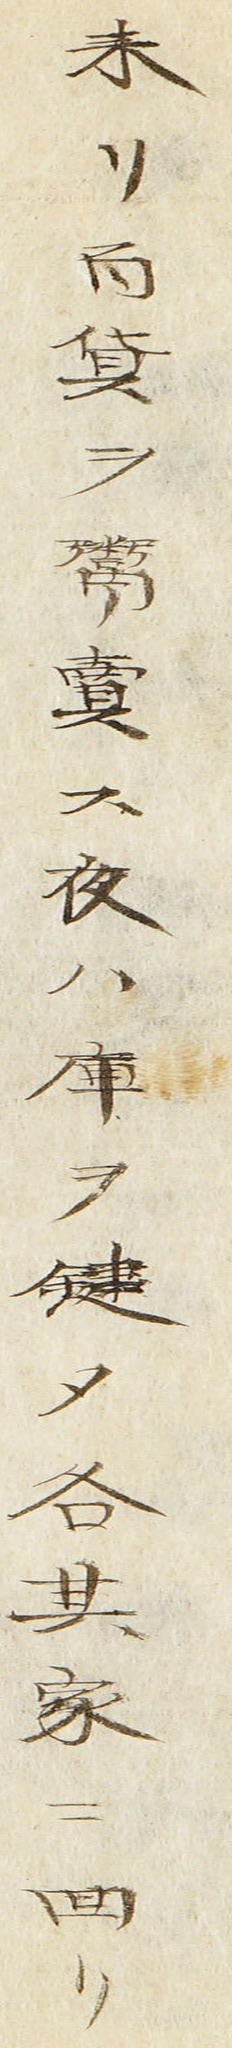来リ百貨ヲ鬻賣ス夜ハ鍵シテ各其家ニ回リ
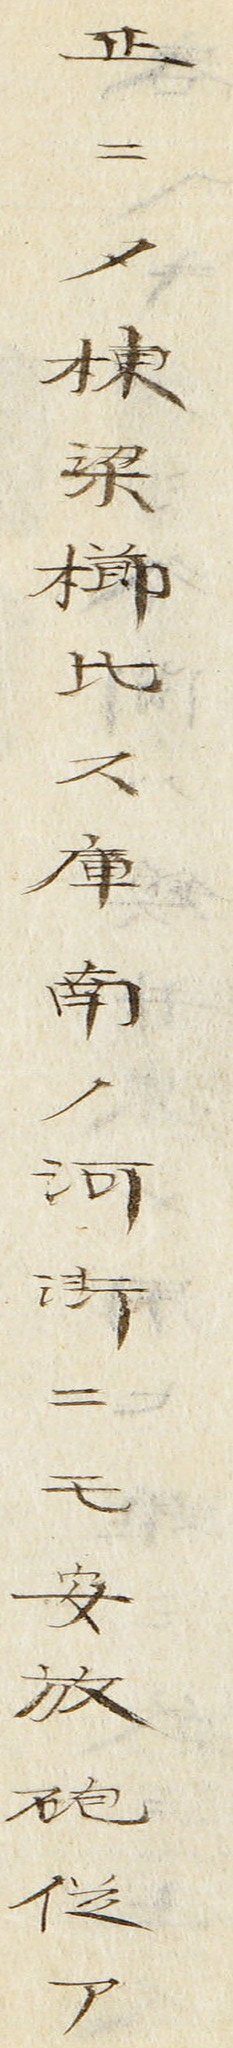正ニシテ棟梁櫛比ス庫南ノ河街ニモ安放砲従ア
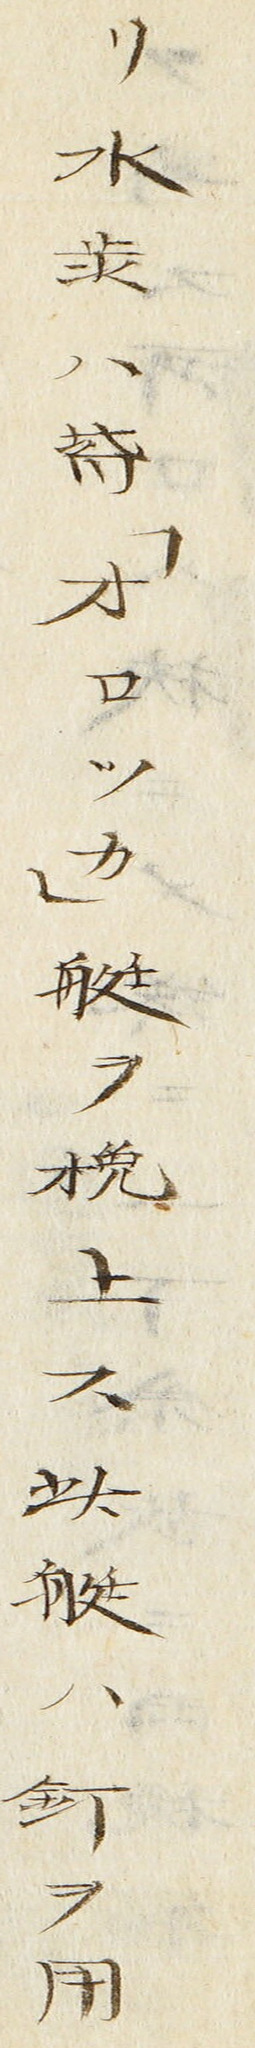リ水歮？ハ皆「オロツカ」艇ヲ梚上ス此艇ハ釘ヲ用
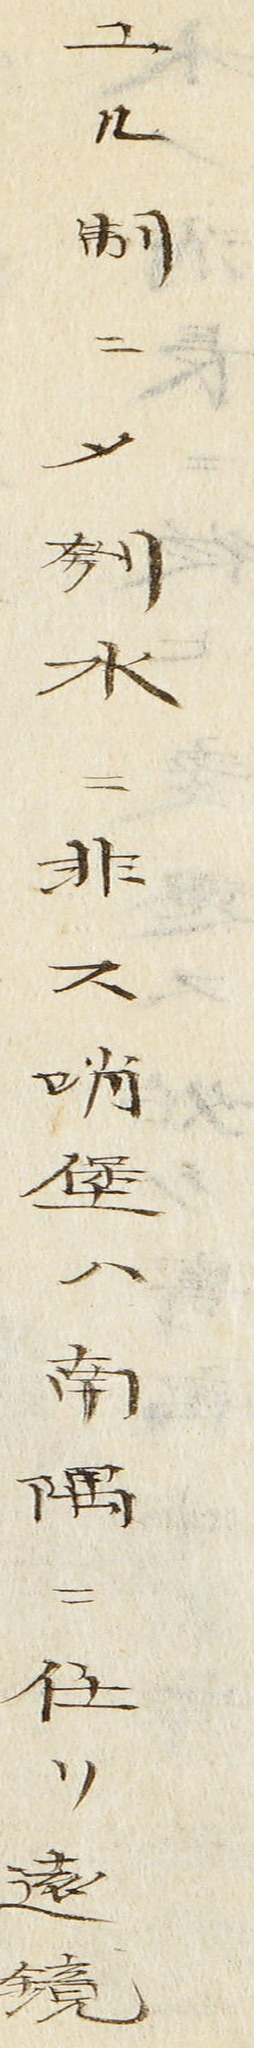ユル制ニシテ刳水ニ非ス哨堡ハ南隅ニ任リ遠鏡
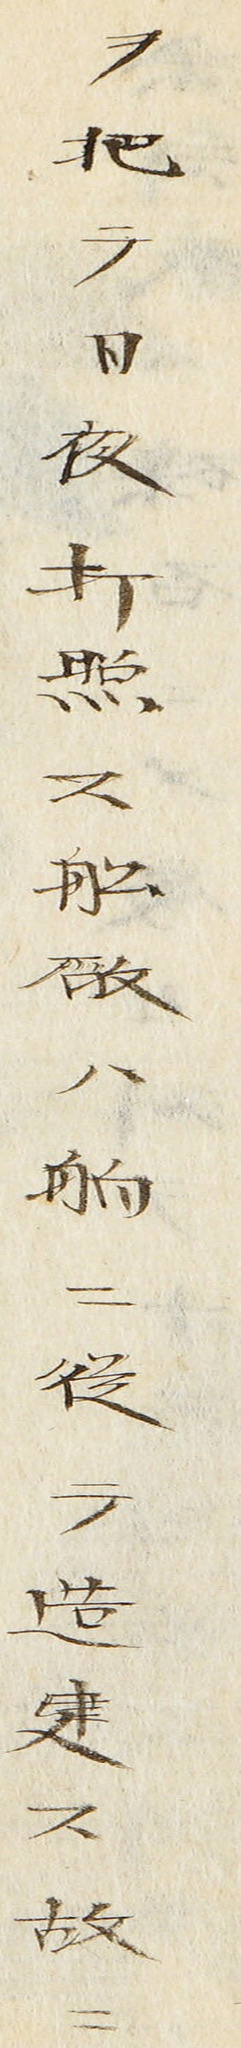ヲ把テ日夜打照ス舩厰ハ舶ニ従テ造建処ス故二
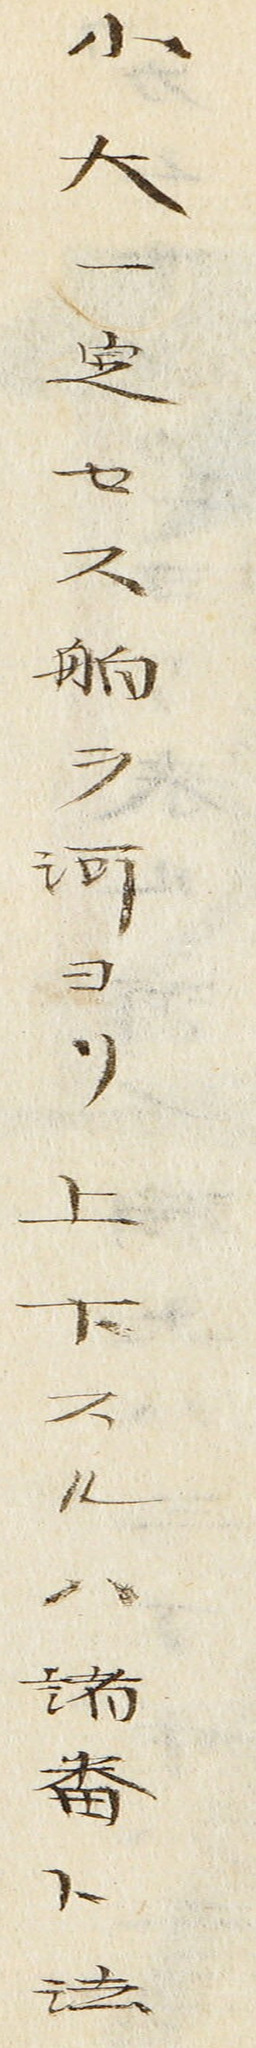小大一定セス舶ヲ河ヨリ上下スルハ諸番ト法
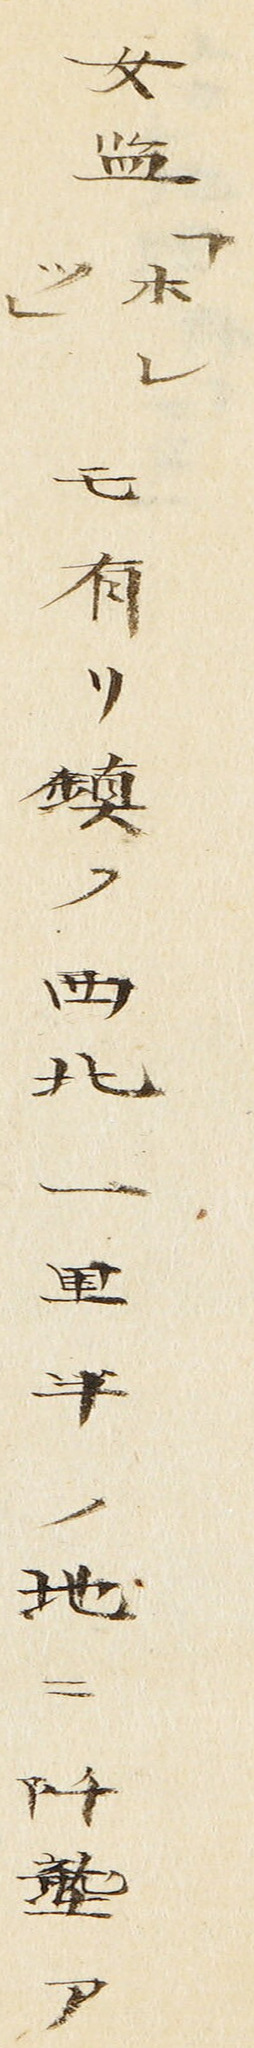女監「ホレツ」モ有リ鎮ノ西北一里半ノ地ニ阡壟ア
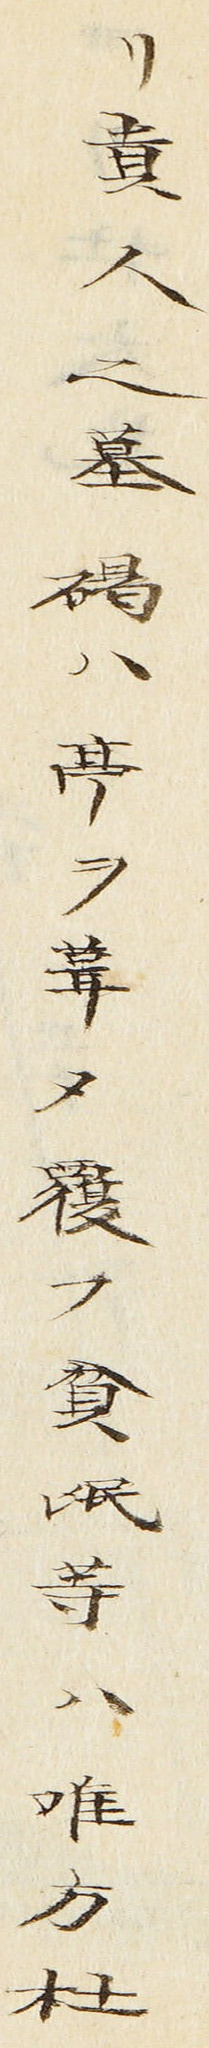リ貴人之墓碣ハ亭ヲ葺シテ覆フ貧氓等ハ唯方杜
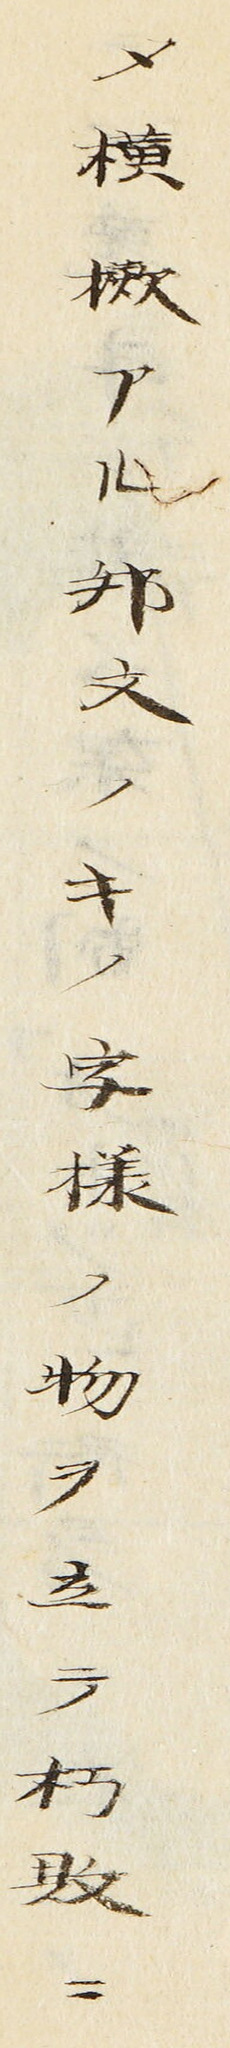シテ横橛アル邦文ノキノ字様ノ物ヲ立テ朽敗ニ
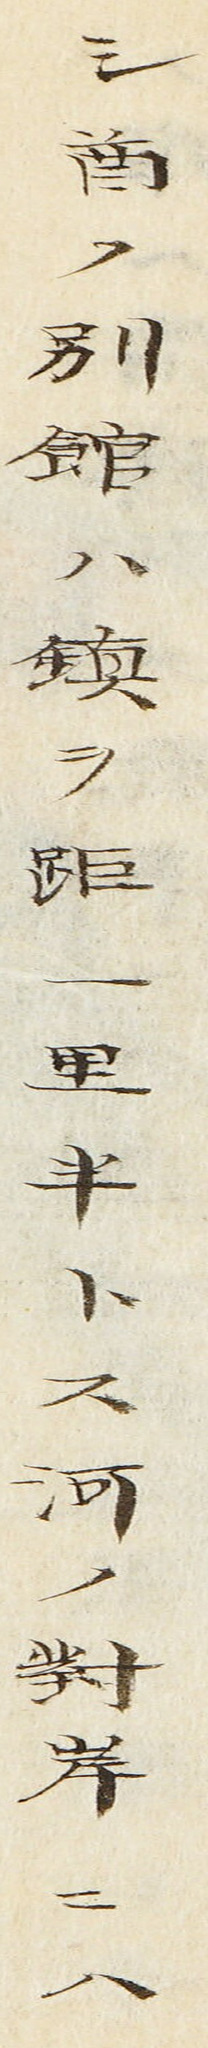シ酋ノ別館ハ鎮ヲ距一里半トス河ノ對岸ニハ
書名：蕃談
